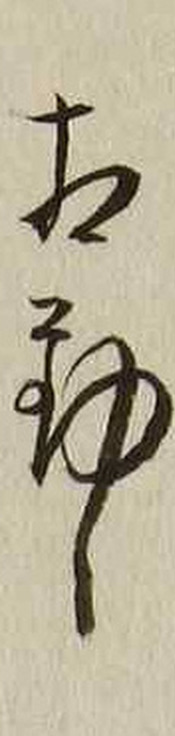相勤候
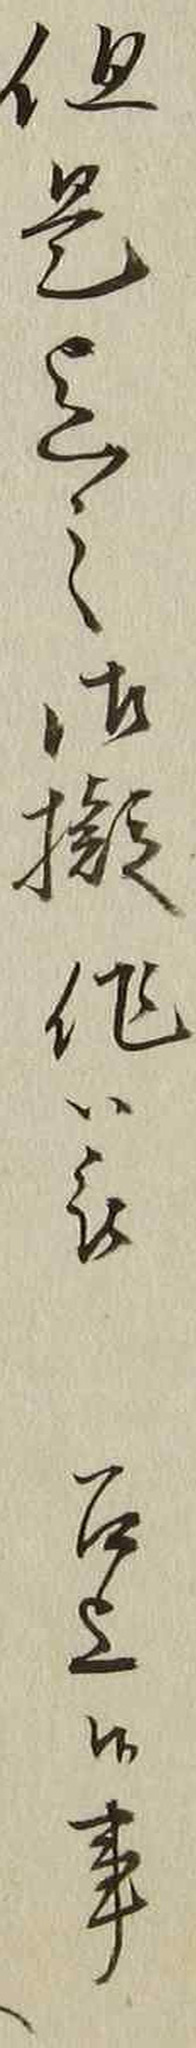但是迄之御擬作ハ被召上候事
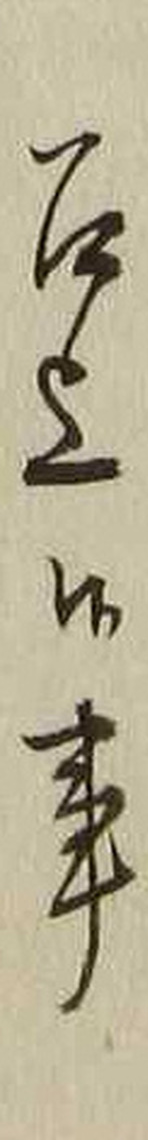召出候事
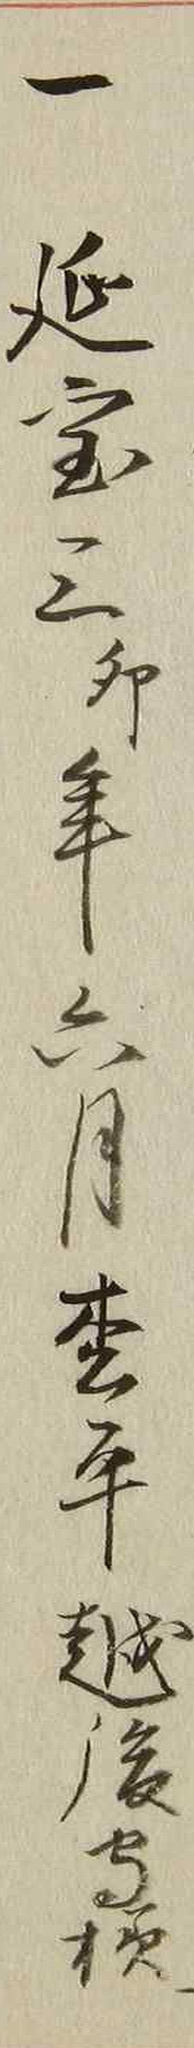一延室三卯年六月松平越後守様へ
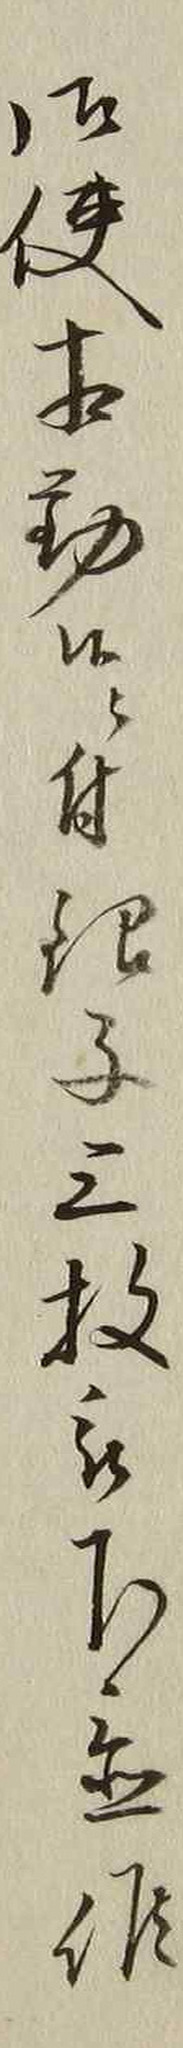御使相勤候ニ付銀子三枚被下置候
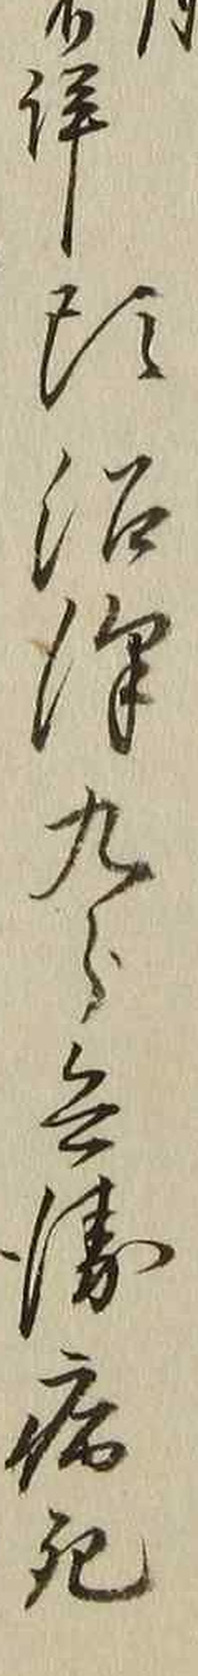不詳頭沼津九郎兵衛病死
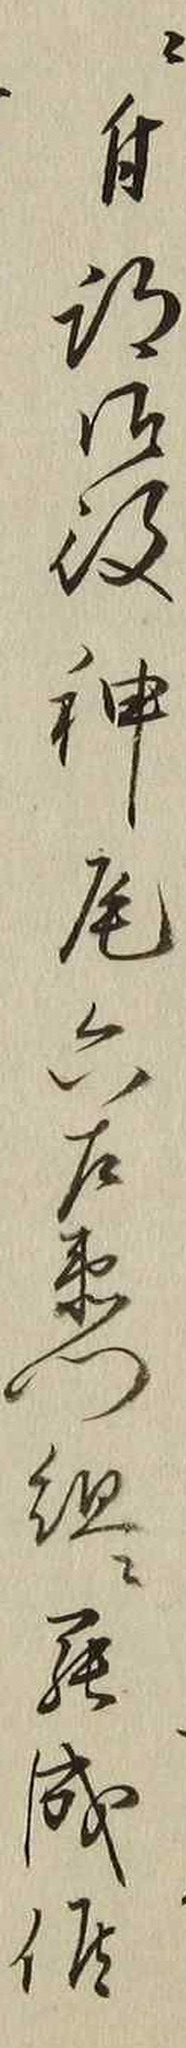ニ付跡御役神尾六左衛門組ニ罷成候
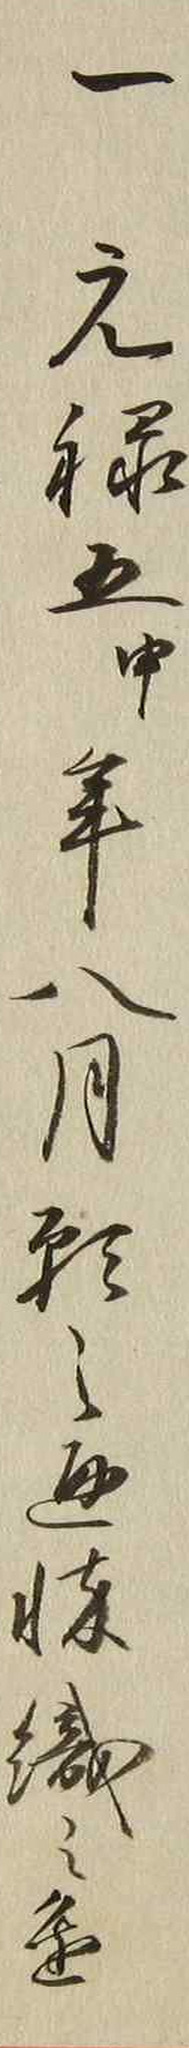一元禄五申年八月願之通悴織之進
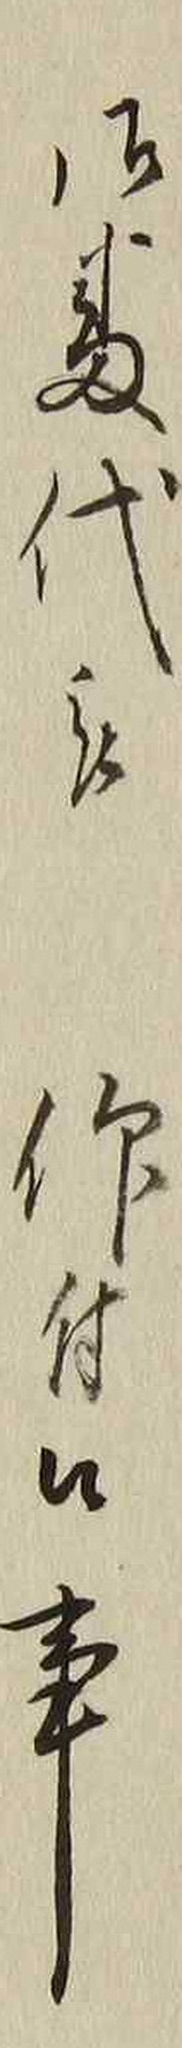御番代被仰付候事
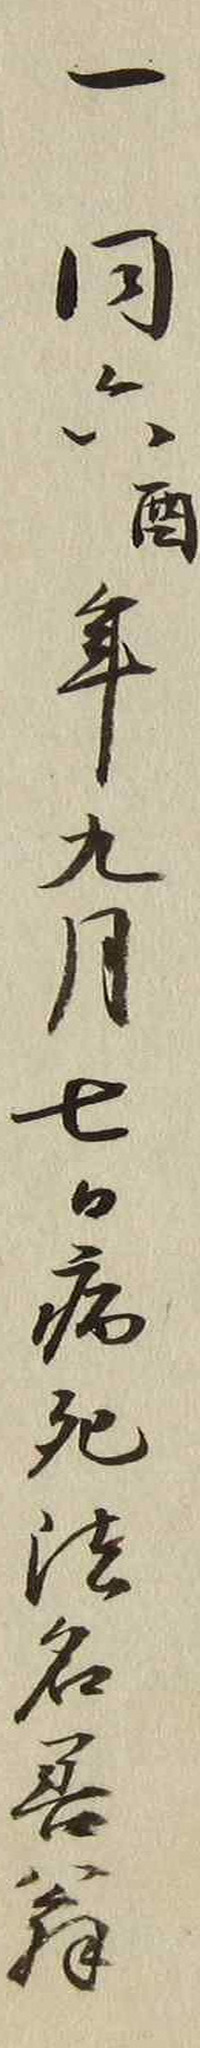一同六酉年九月七日病死法名善翁
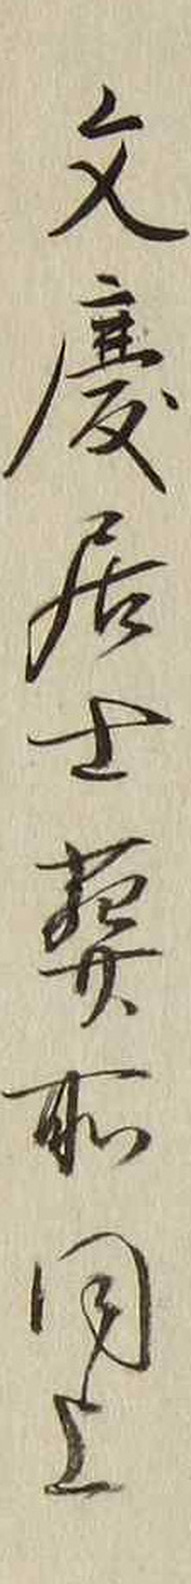文慶居士葬所同上
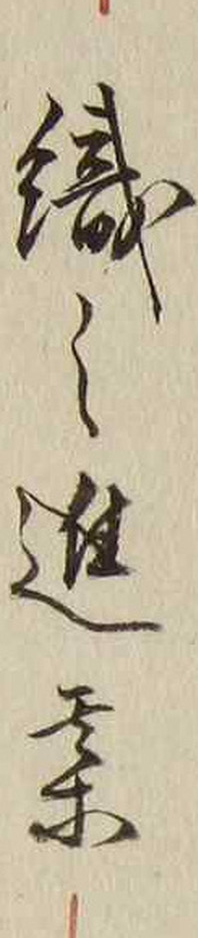織之進某

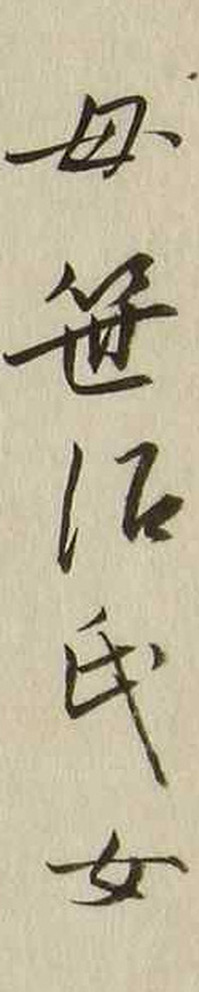母笹沼氏女
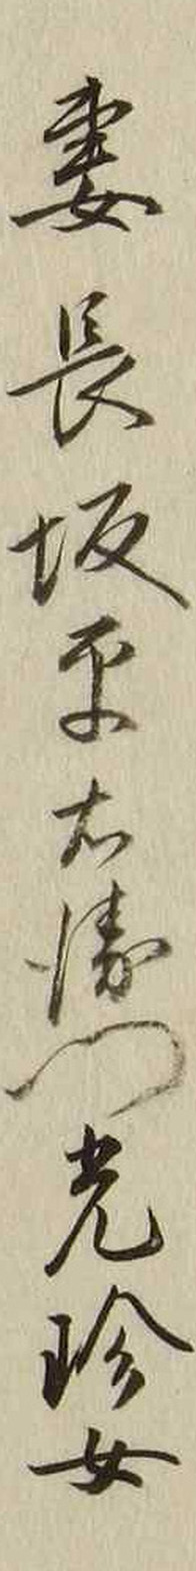妻長坂平右衛門光珍女
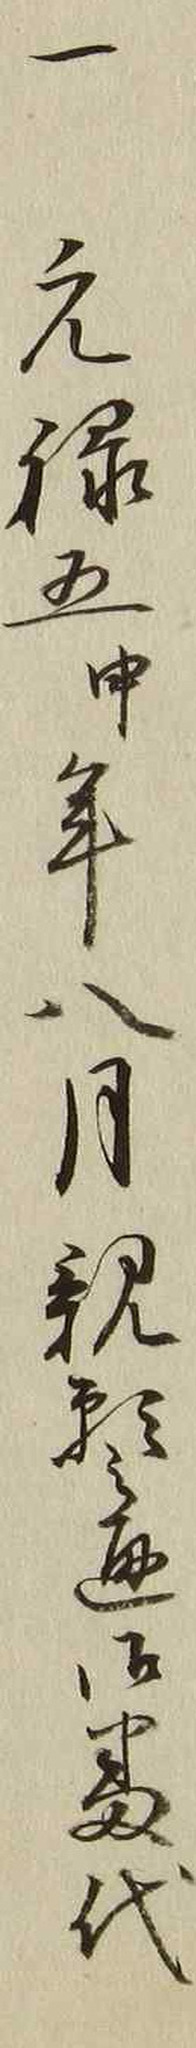一元禄五申年八月親願之通御番代
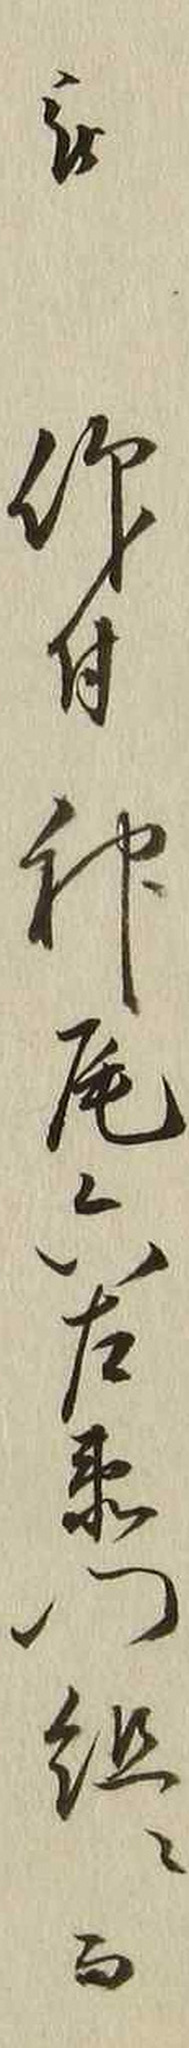被仰付神尾六左衛門組ニ而
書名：諸士系譜　巻之22　い之部22
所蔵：会津若松市立会津図書館
